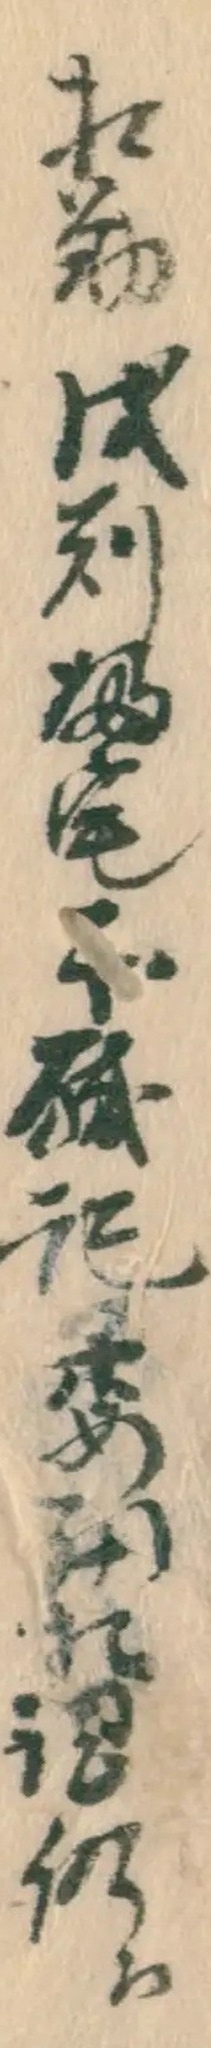相勤戌刻帰宅本職記委細相認仍而
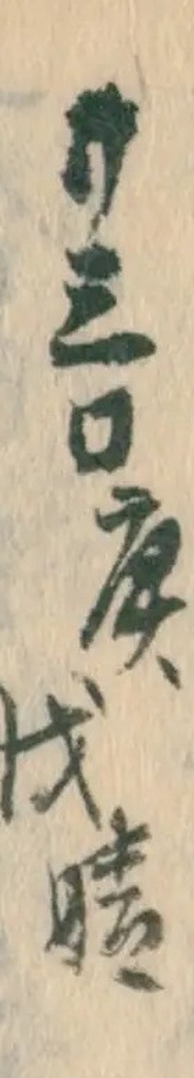廿三日庚戌晴
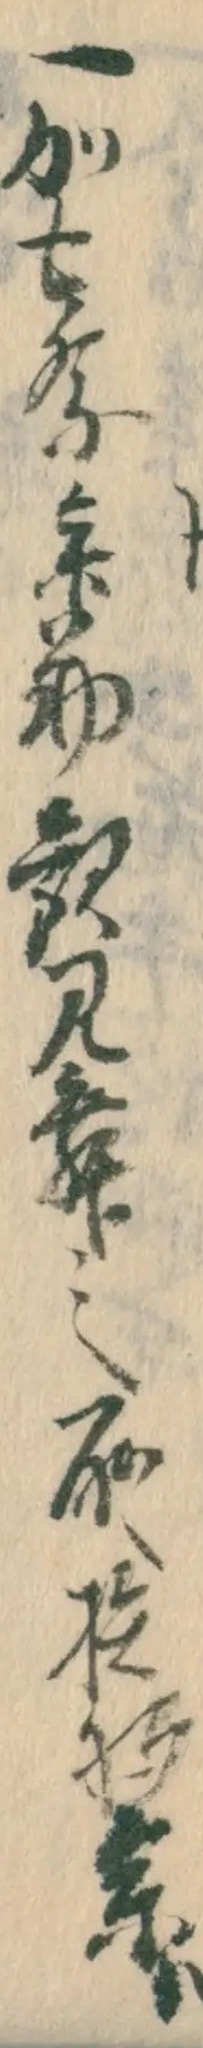一加も祭参勤歓見舞之所へ挨拶参ル

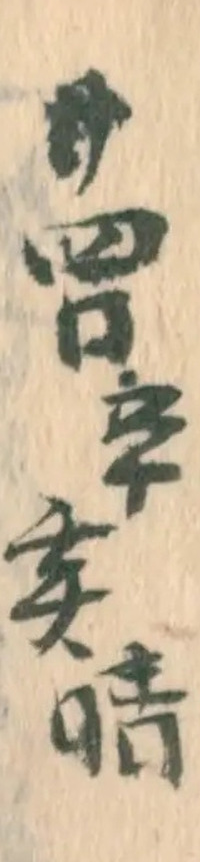廿四日辛亥晴
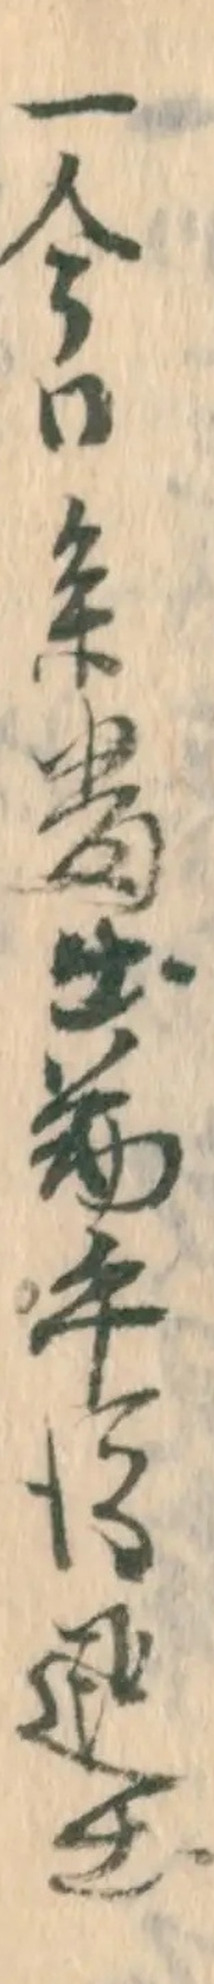一今日参番出勤午後退出
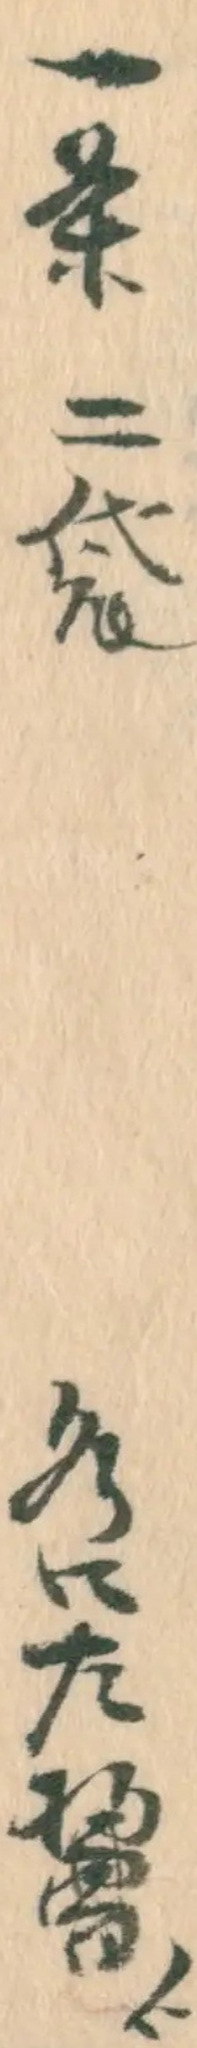一茶二袋水口左将監ゟ
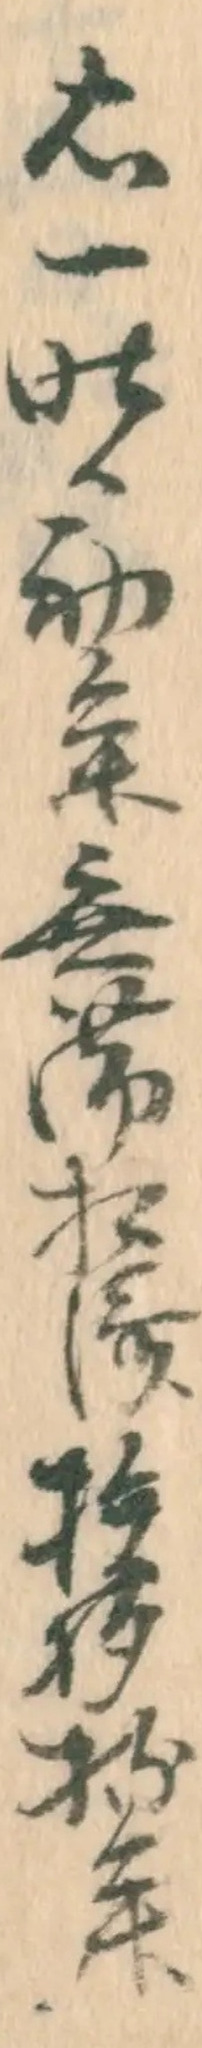右一昨日初参無滞相済挨拶持参
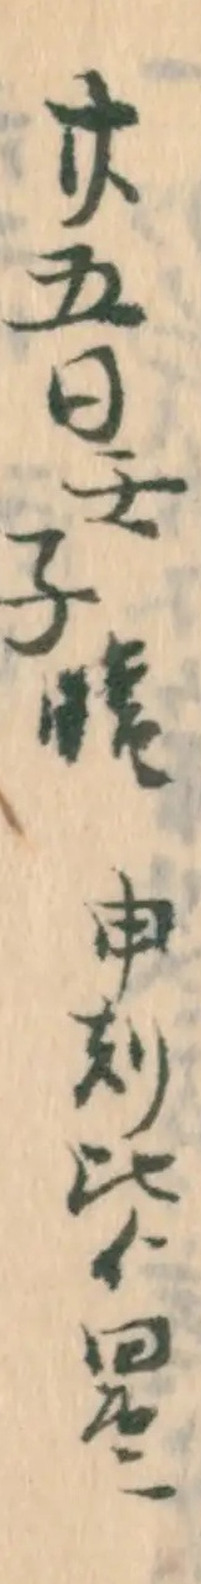廿五日壬子晴申刻頃ゟ曇
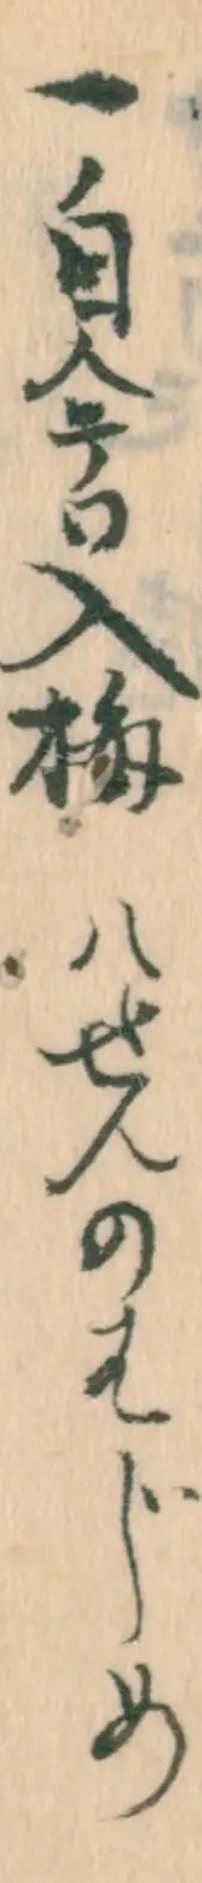一自今日入梅八せんのはじめ
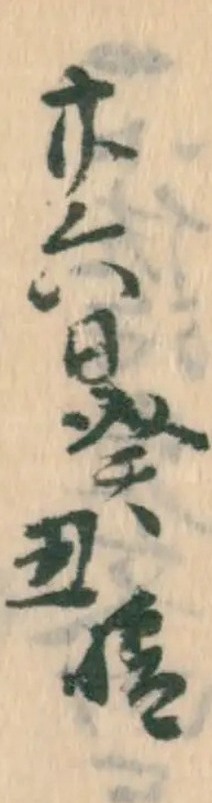廿六日癸丑晴
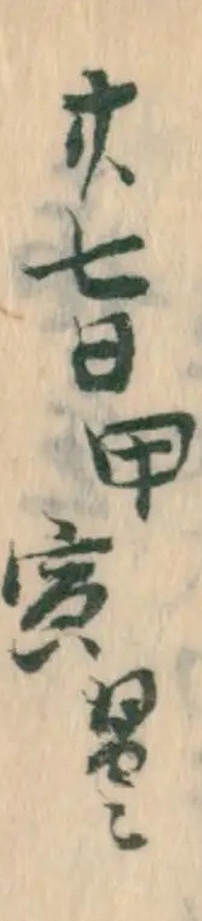廿七日甲寅曇
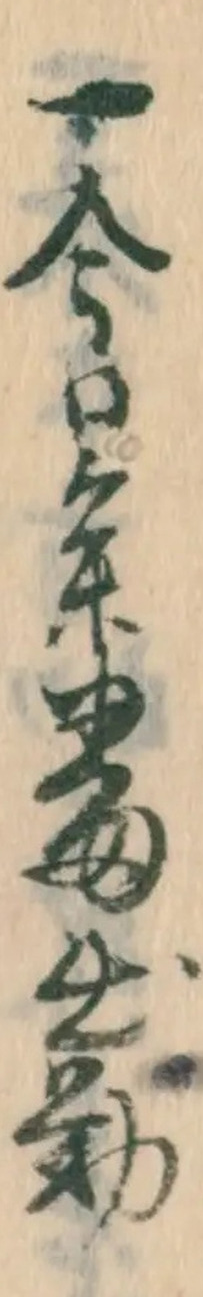一今日参番出勤
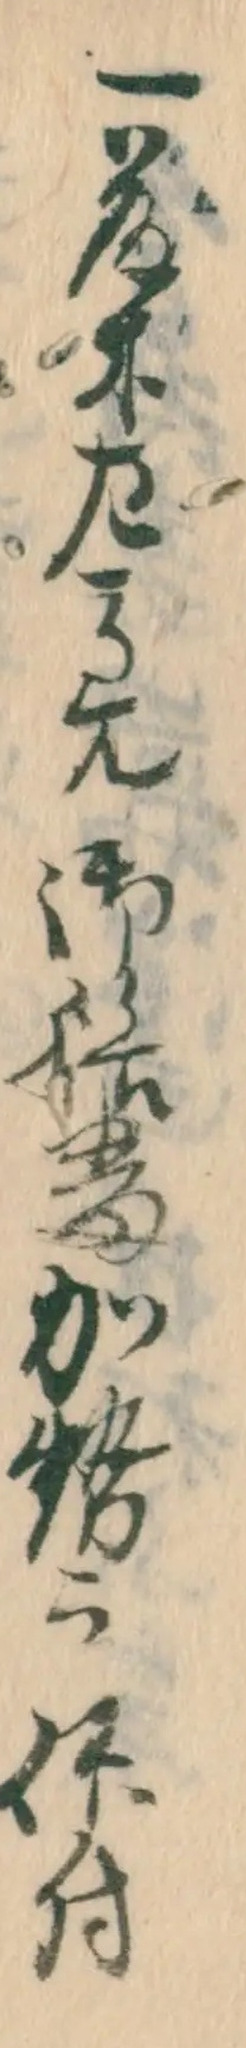一藤木左馬允御膳番加勢被仰付
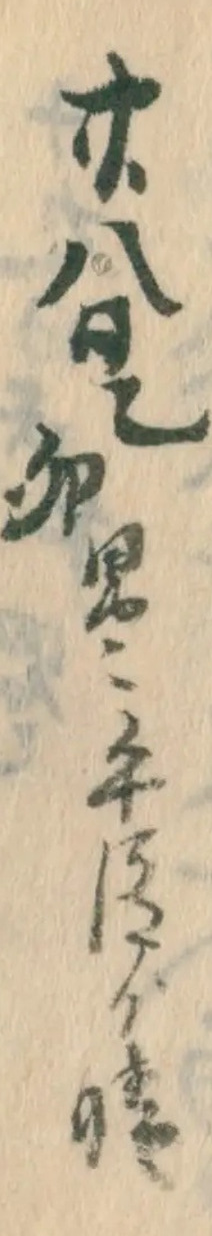廿八日乙卯曇午後ゟ晴

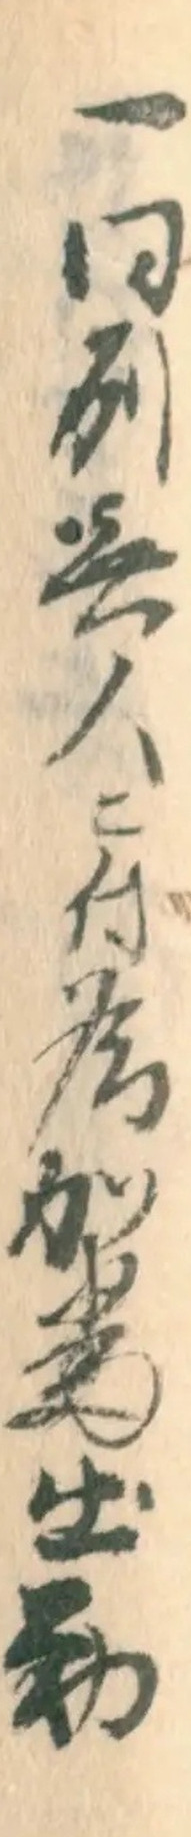一同列無人ニ付為加番出勤
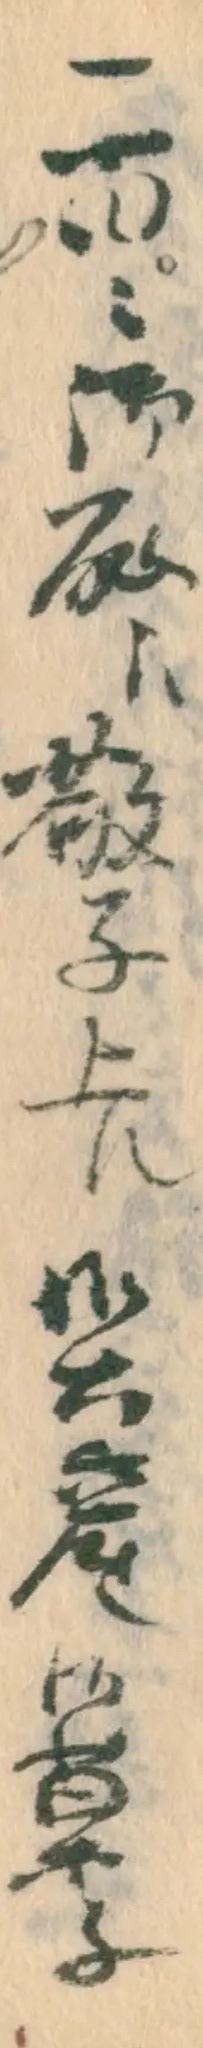一百々御所え敬子上ル御土産御菓子
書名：禁裏御所御用日記. [131]
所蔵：国立国会図書館 National Diet Library, JAPAN
